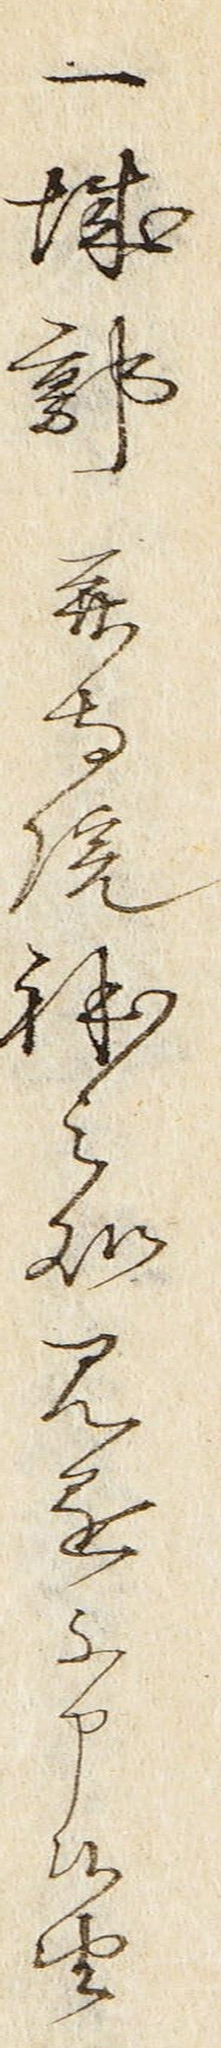一城郭并寺院躰之処見懸不申候由
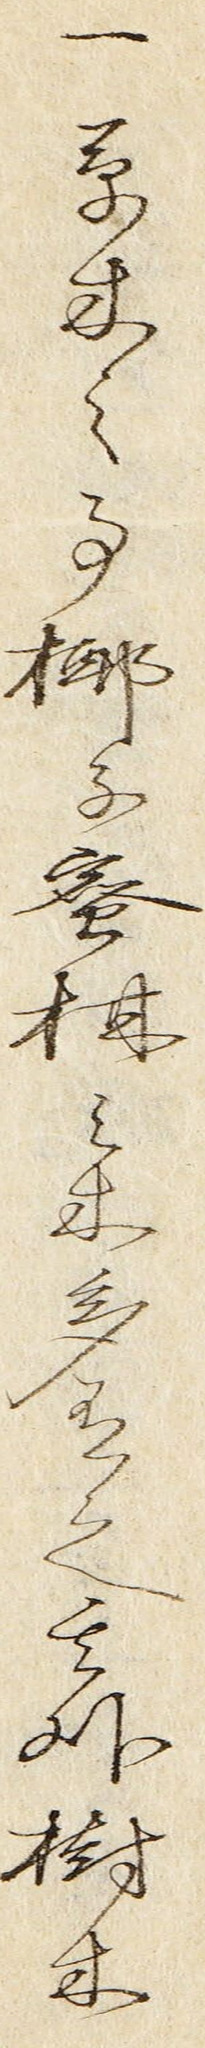一草木之事椰子蜜柑之木多有之其外樹木
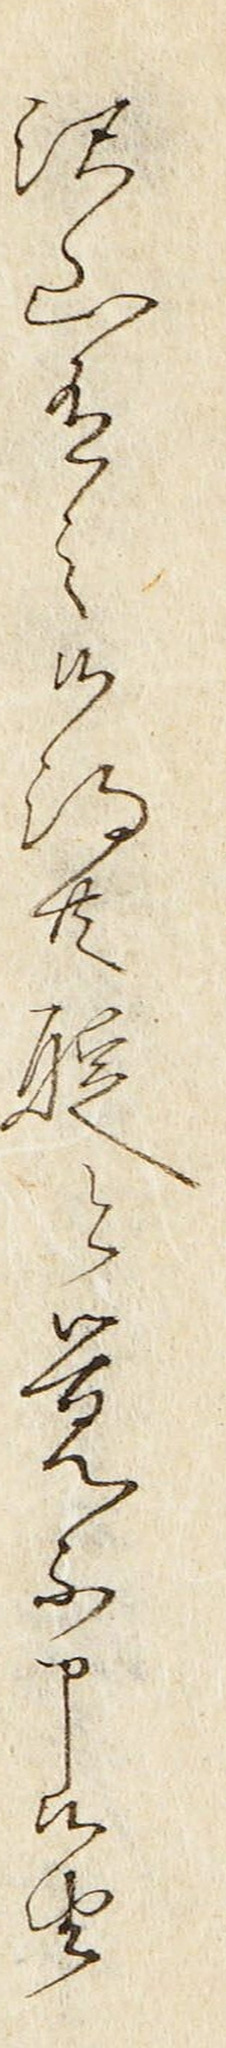沢山有之候得共聢と覚不申候由
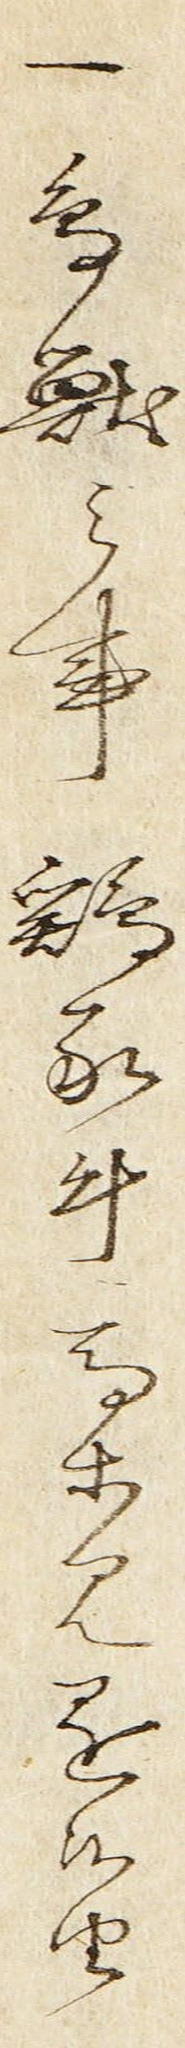一鳥獣之事鶏豕牛馬等見懸候由
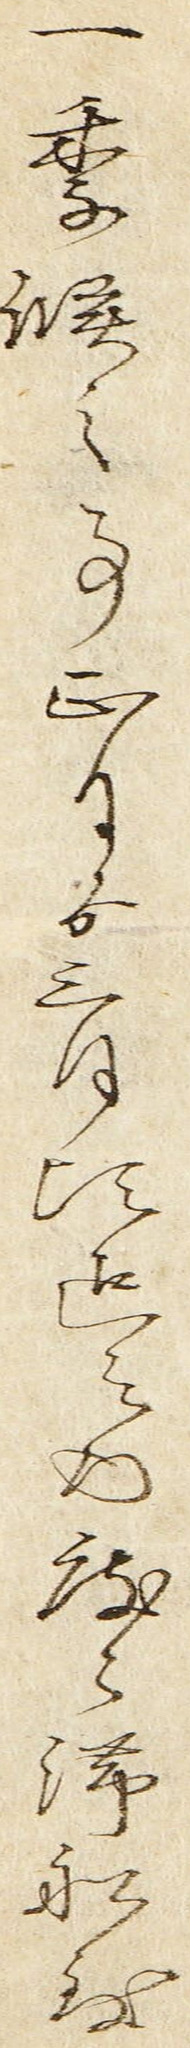一季候之事正月ゟ三月比迄之内度々滞船致

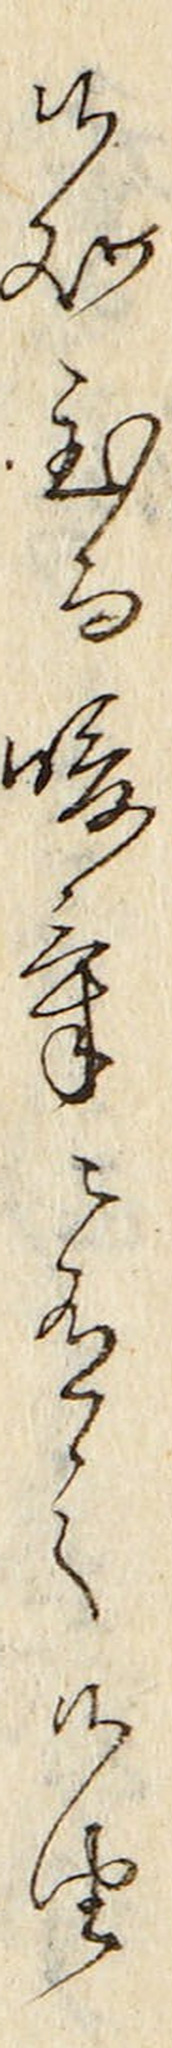候処至而暖気に有之候由
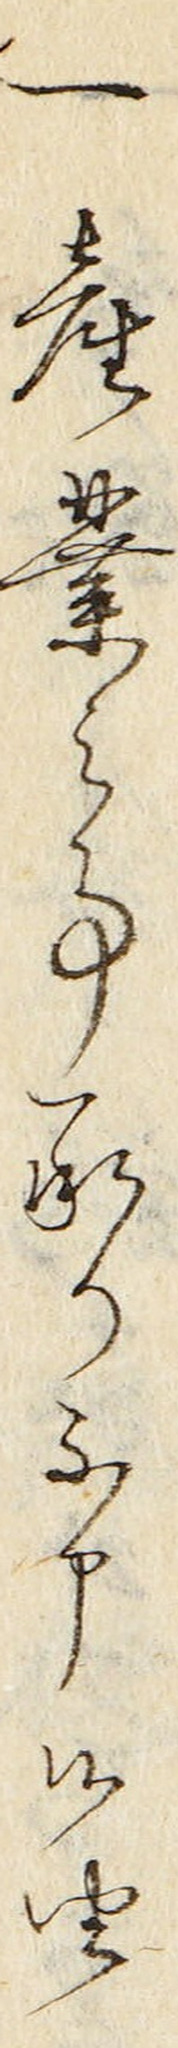一産業之事承り不申候由
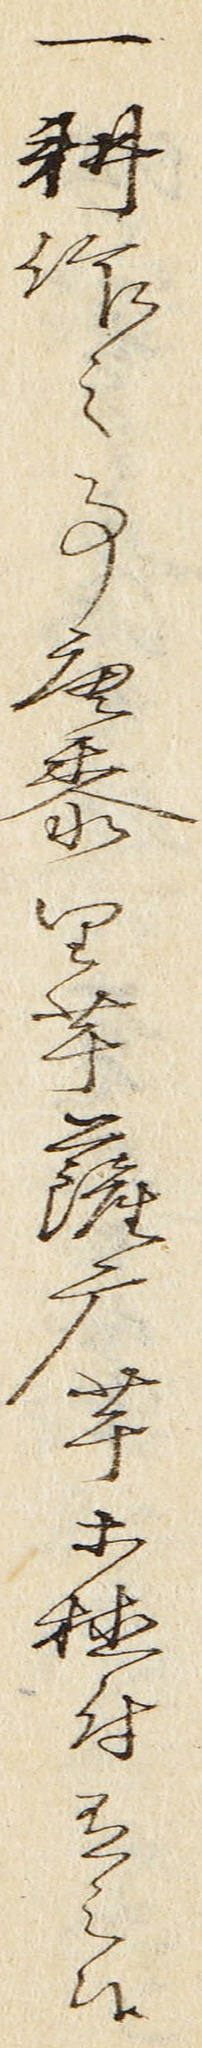一耕作之事唐黍里芋薩摩芋等植附有之候
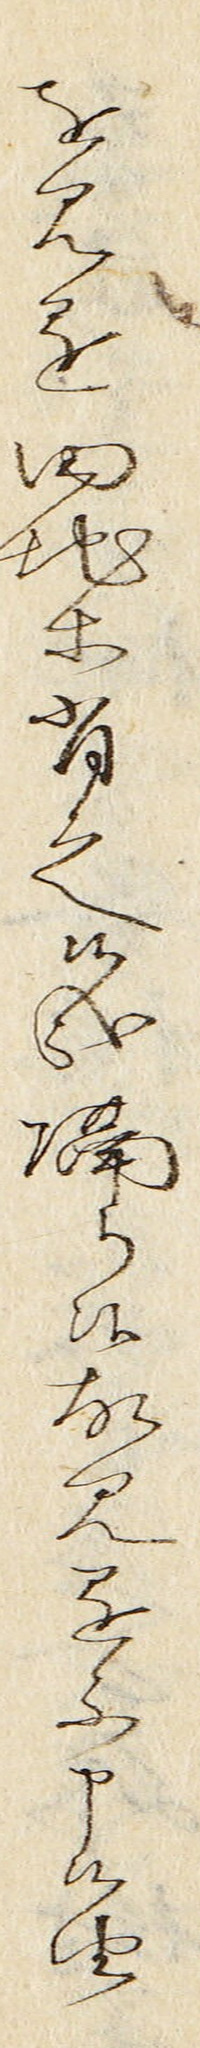を見懸田地等有之候哉隔る候故見懸不申候由
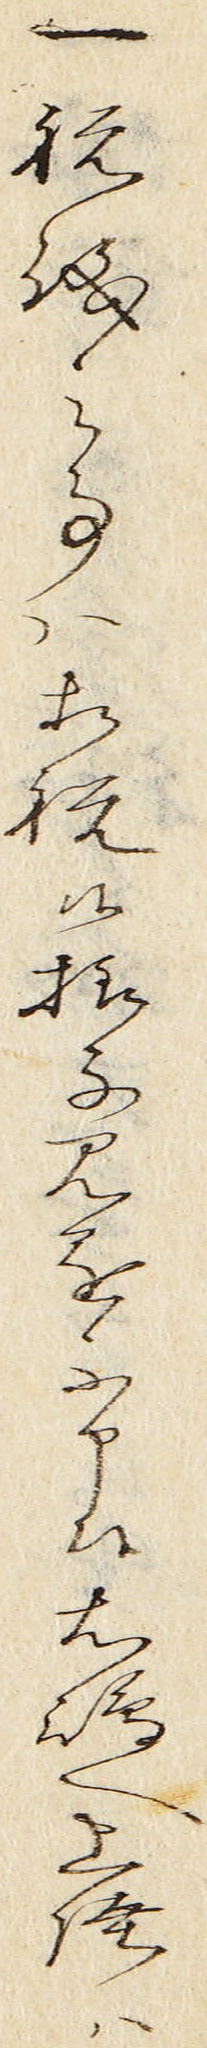一祝儀之事は相祝候様子見懸不申候右嶋へ上陸は
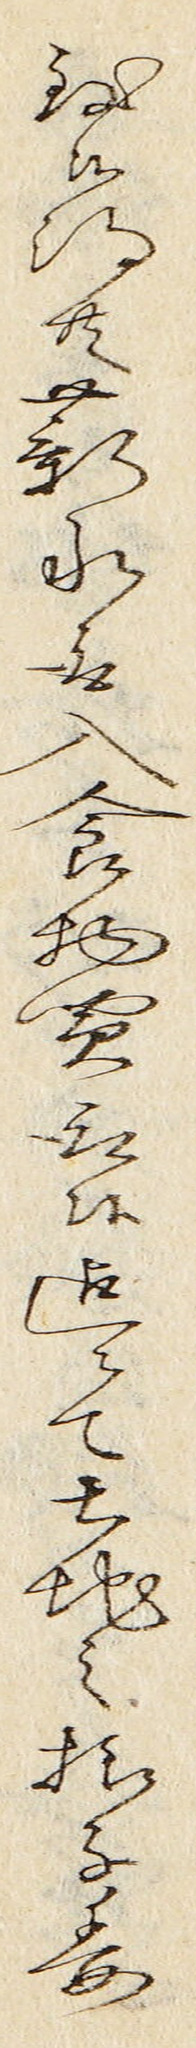致候得共薪水取入食物買取候迄にて土地之様子委
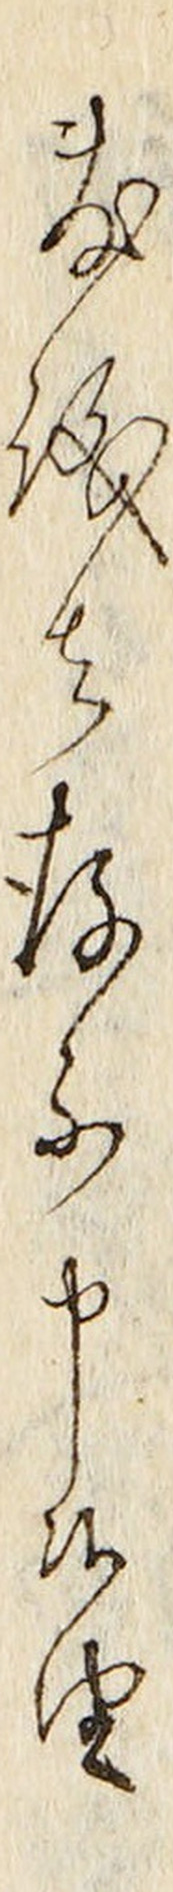敷儀は存不申候由
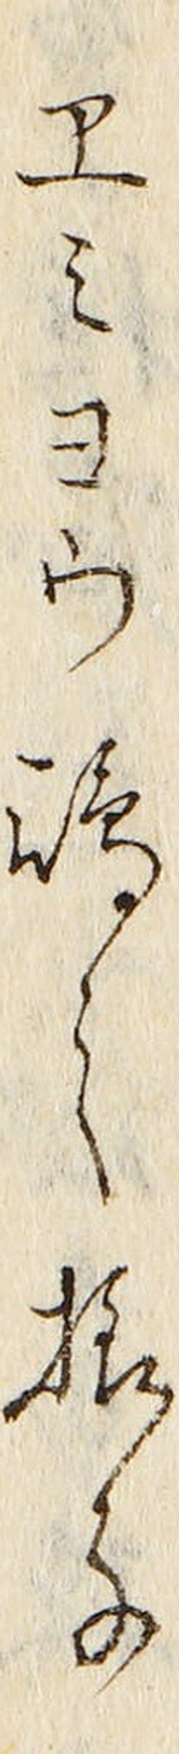エミヨウ嶋之様子
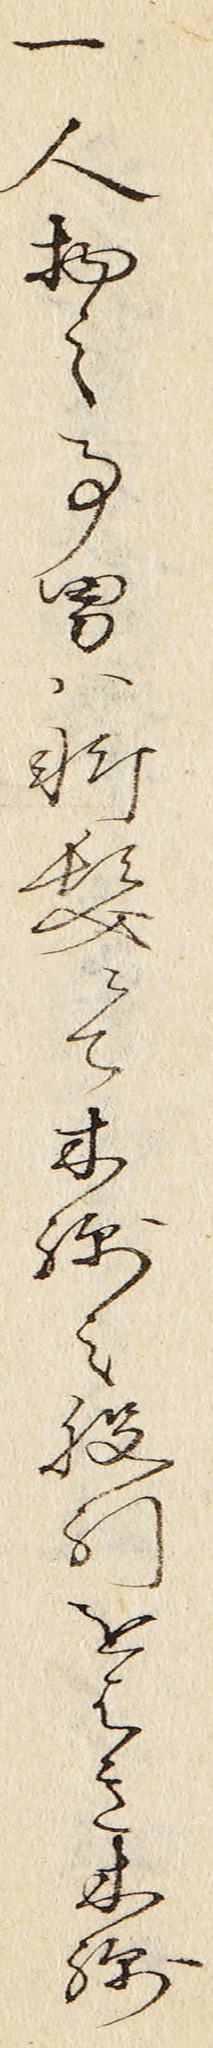一人物之事男は斬髪にて木綿之股引をはき木綿
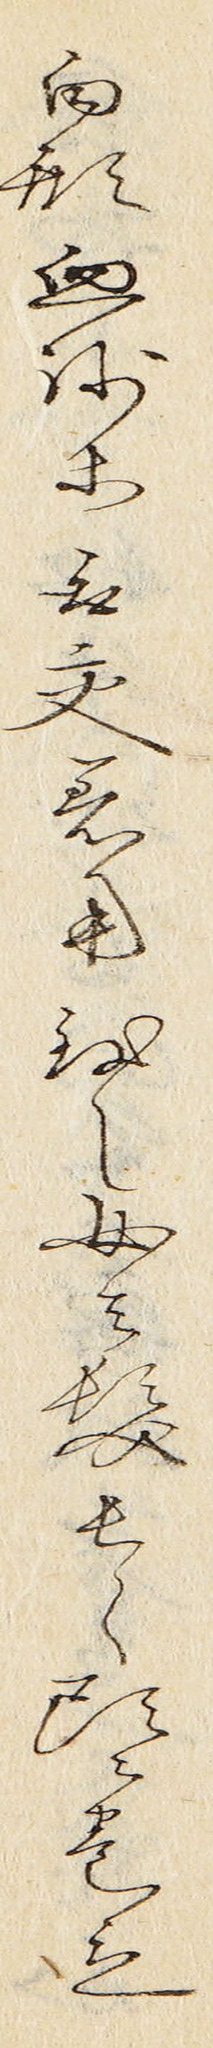白形紗等取交着用致し女は髪長く頭に巻立
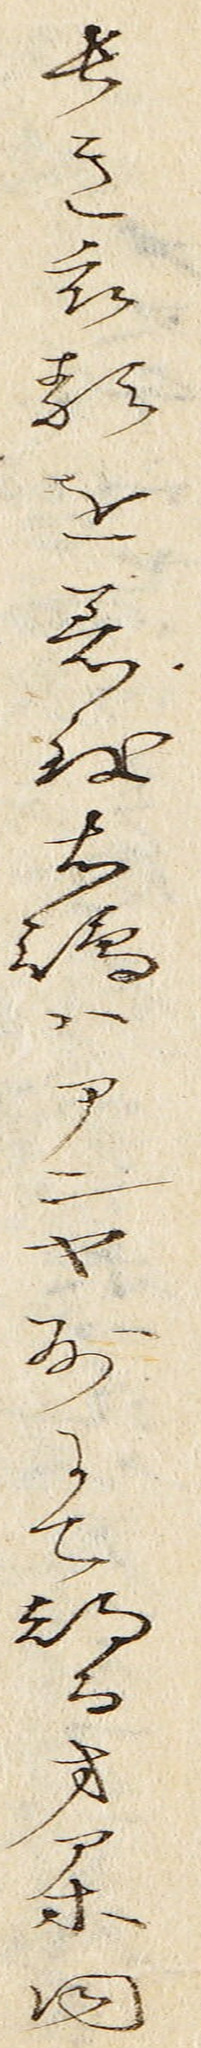長き衣類を着致右嶋はアンヤ州にて都而オアホ同
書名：土佐中浜万次郎漂流記
